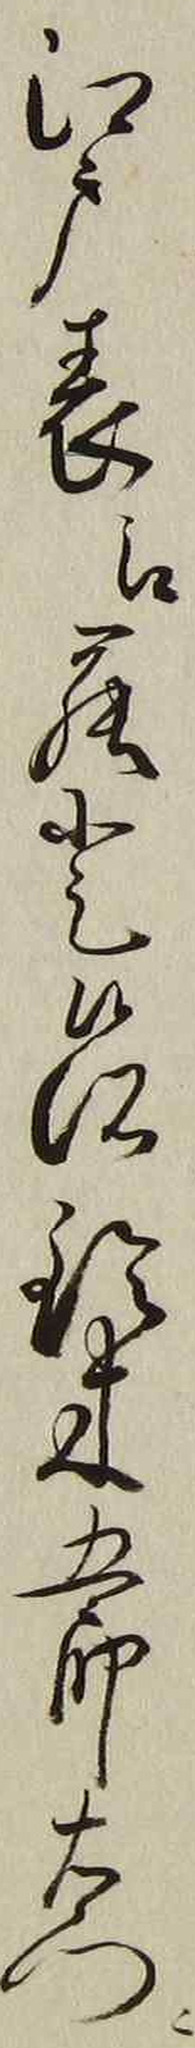江戸表江罷登候所鈴木五郎右衛門
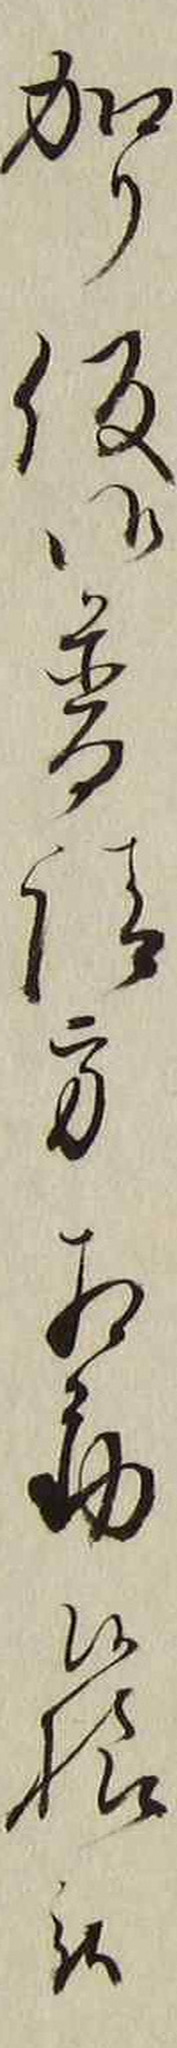加り仮御普請方相勤候様被
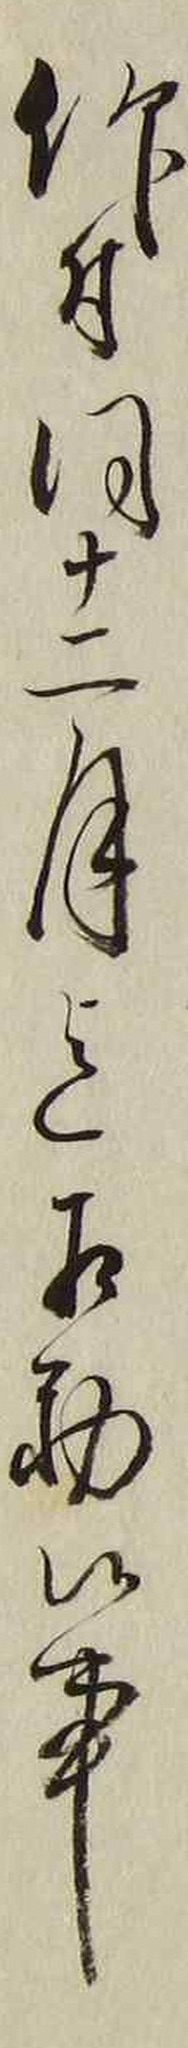仰付同十二月迄相勤候事

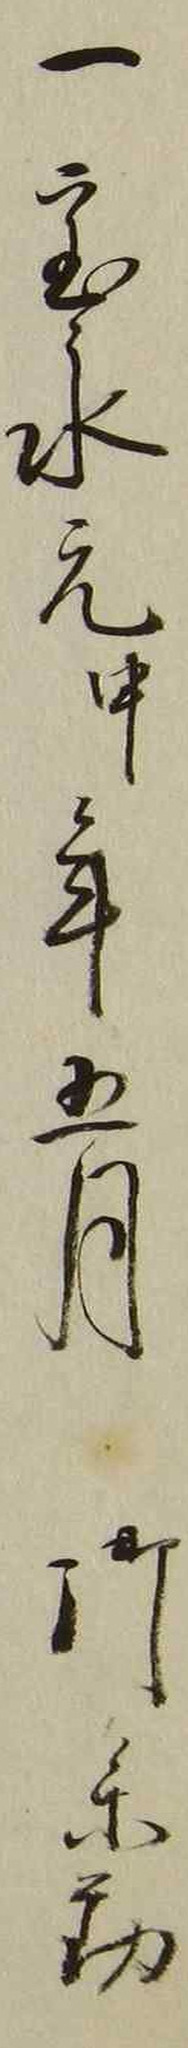一宝永元申年五月御参勤
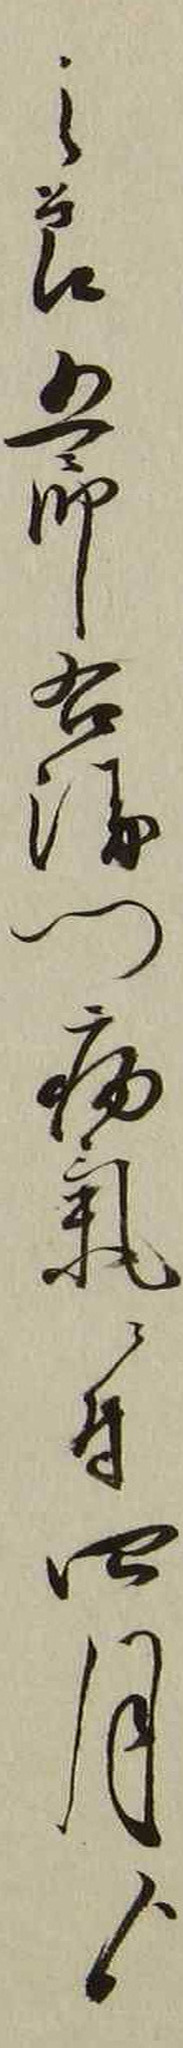之節五郎右衛門病気ニ付四月ゟ
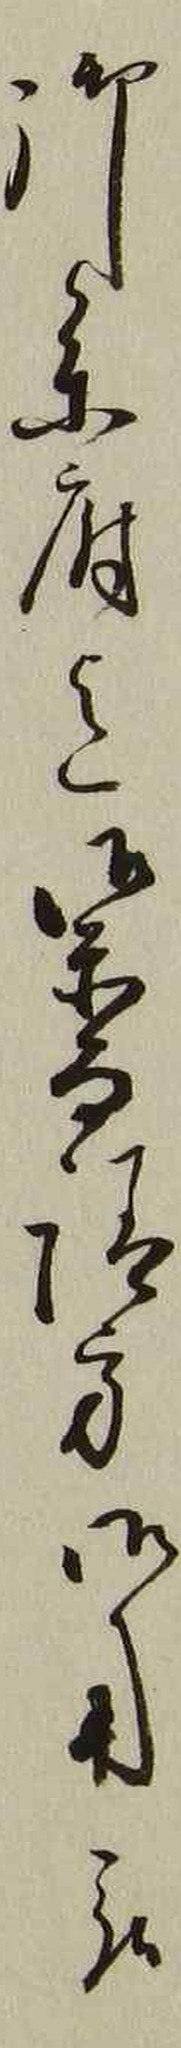御参府迄御普請方御用被
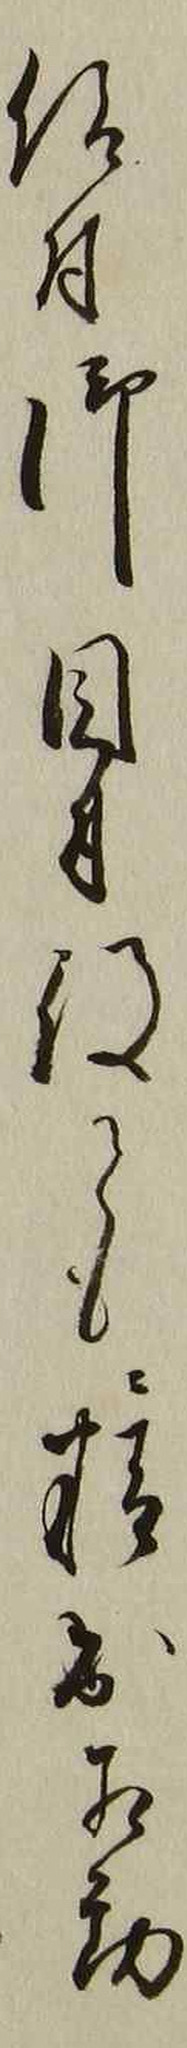仰付御目付役ともニ精出相勤
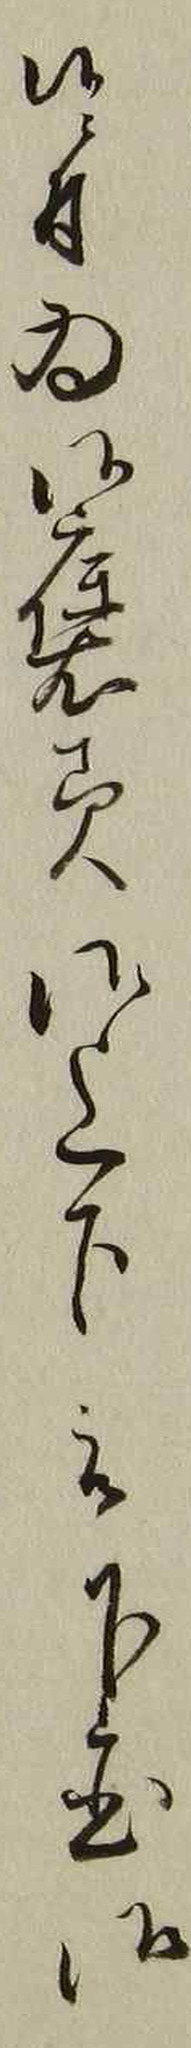候ニ付為御褒美御上下被下置御
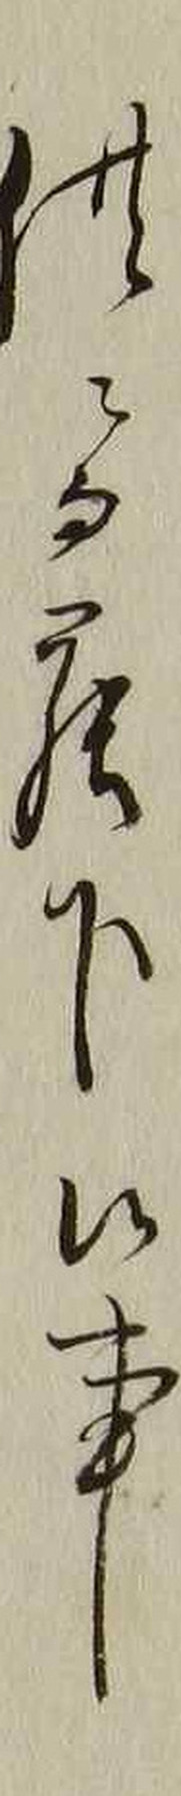供ニ而罷下候事
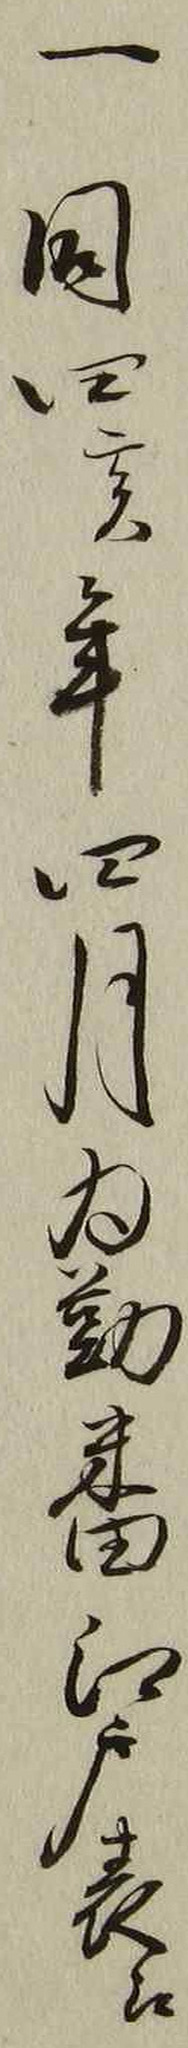一同四亥年四月為勤番江戸表江
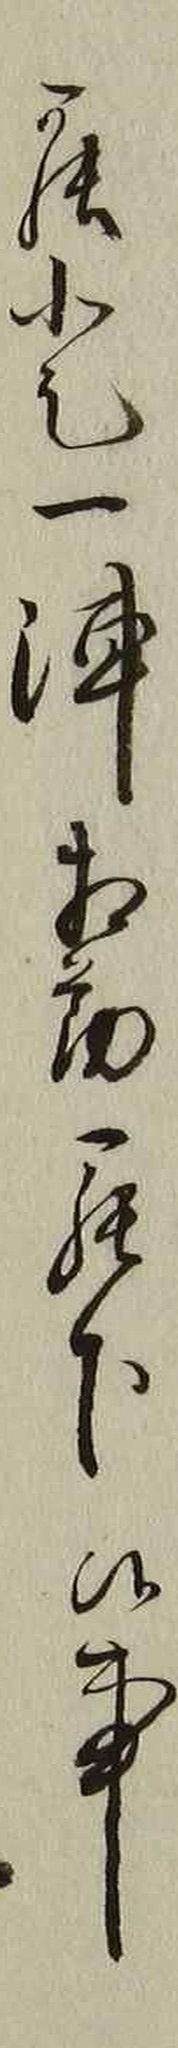罷登一陣相勤罷下候事
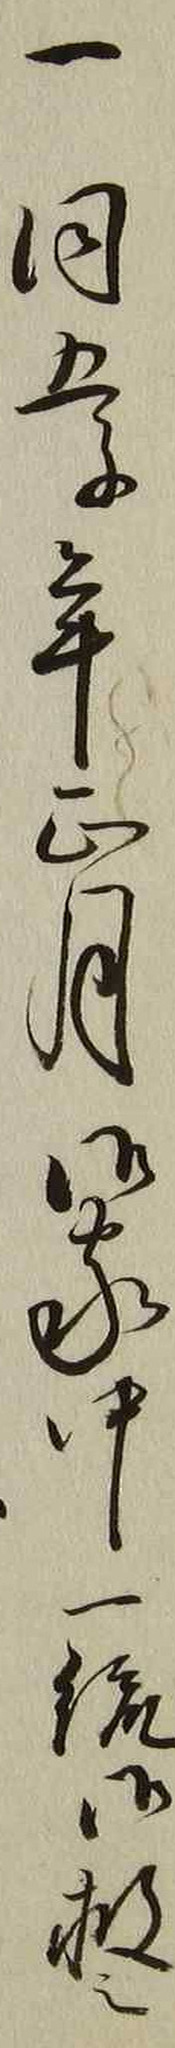一同五子年正月御家中一統御救之
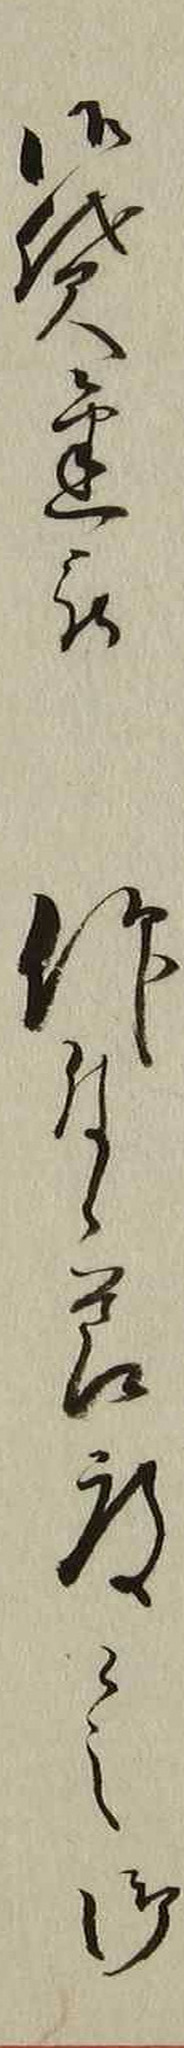御貸金被仰付候節度々之御
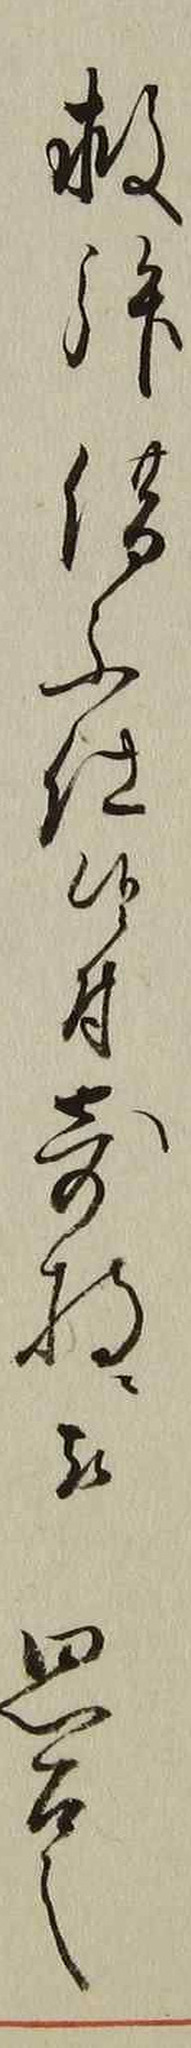救拝借不仕候ニ付奇特ニ被思召之
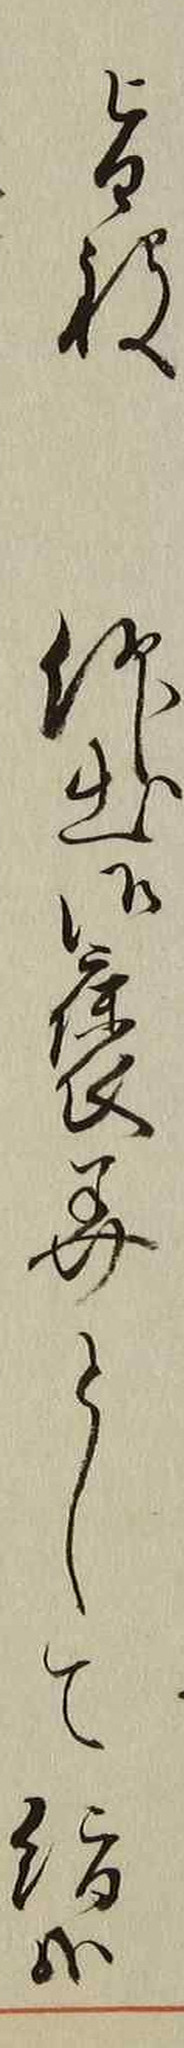旨被仰出御褒美として絹弐
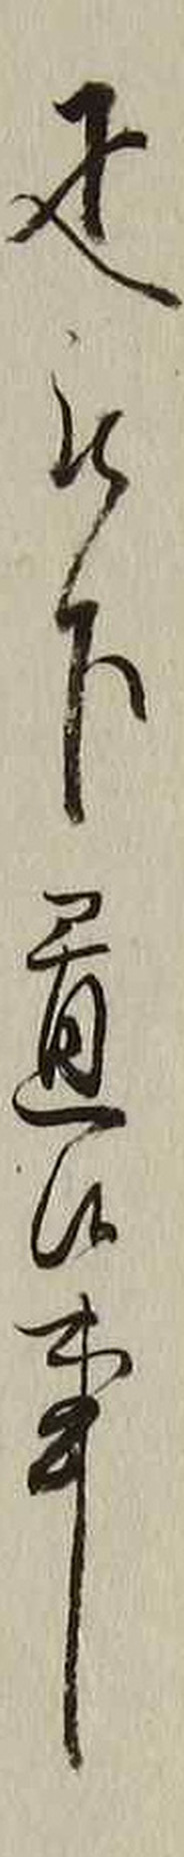疋被下置候事
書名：諸士系譜　巻之2　い之部2
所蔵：会津若松市立会津図書館
